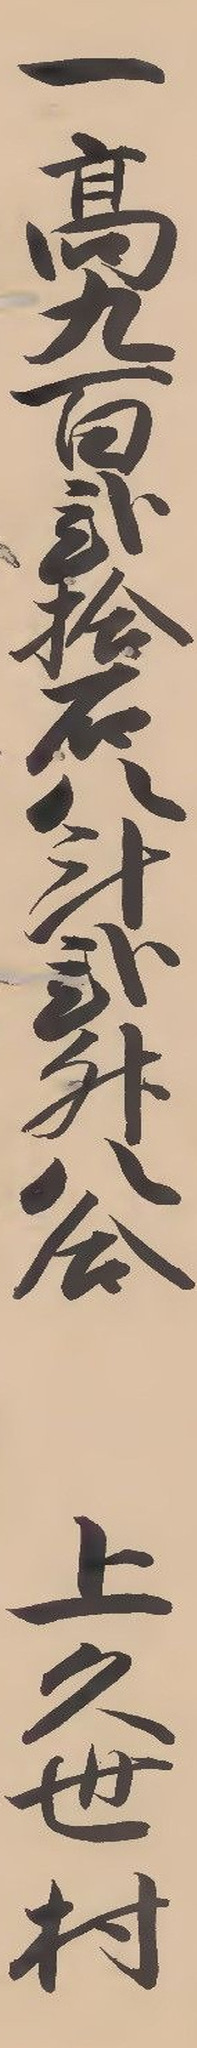一高九百弐拾石八斗弐升八合上久世村
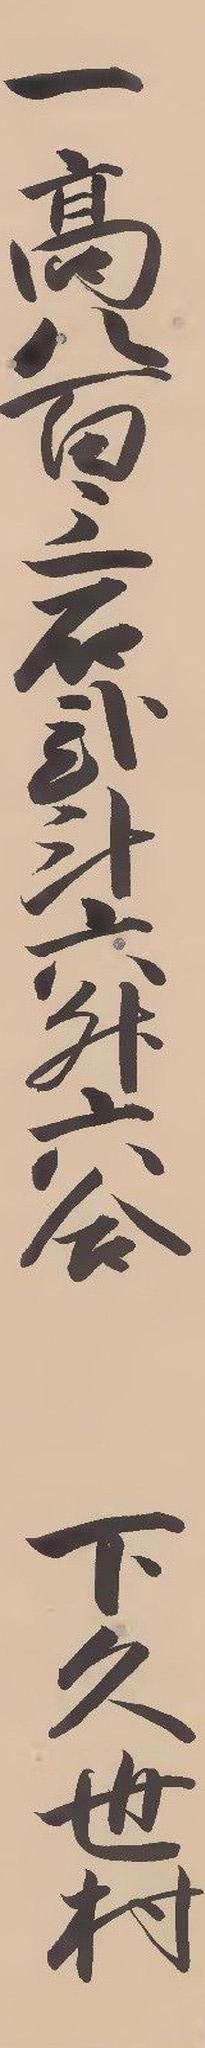一高八百三石弐斗六升六合下久世村
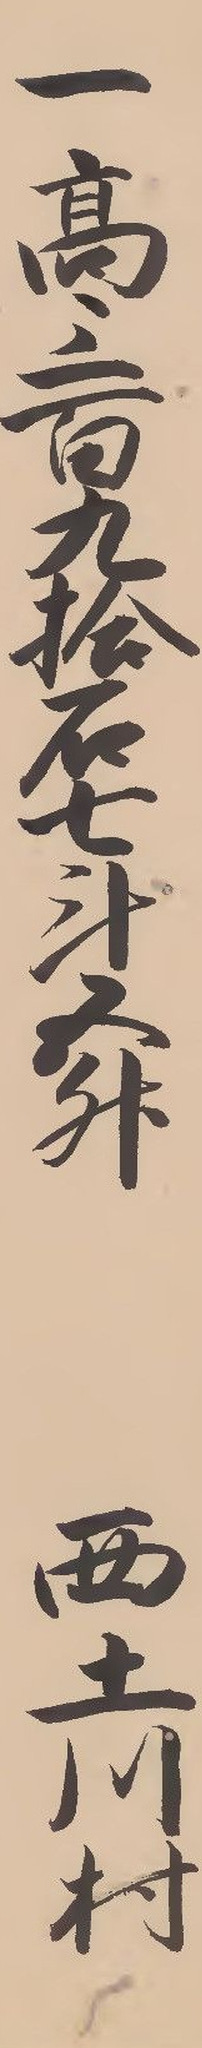一高三百九拾石七斗五升西土川村

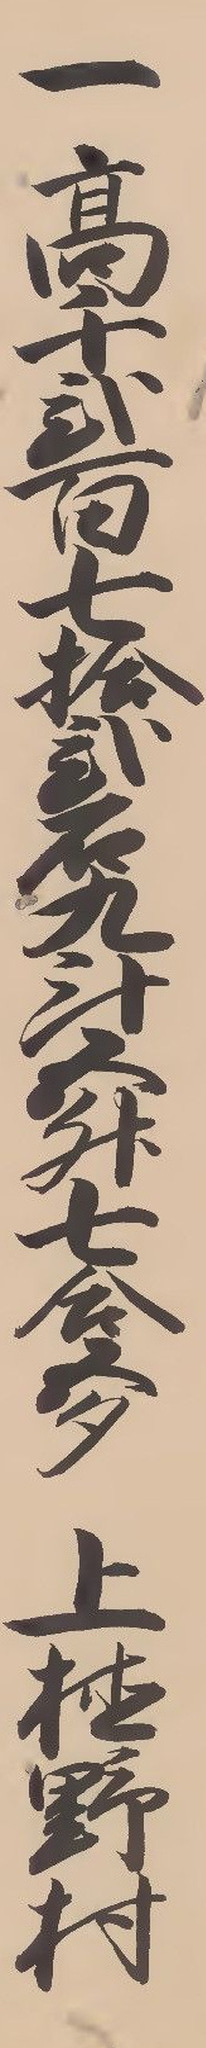一高千弐百七拾弐石九斗五升七合五勺上植野村
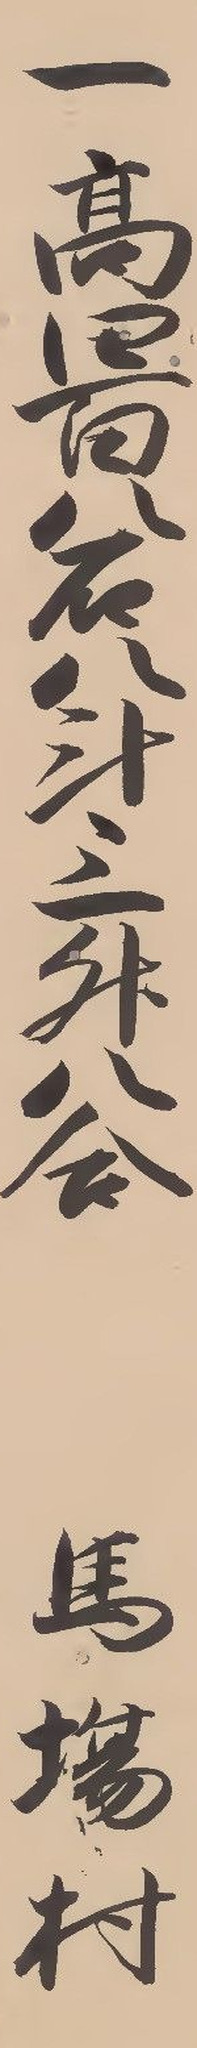一高四百八石八斗三升八合馬場村
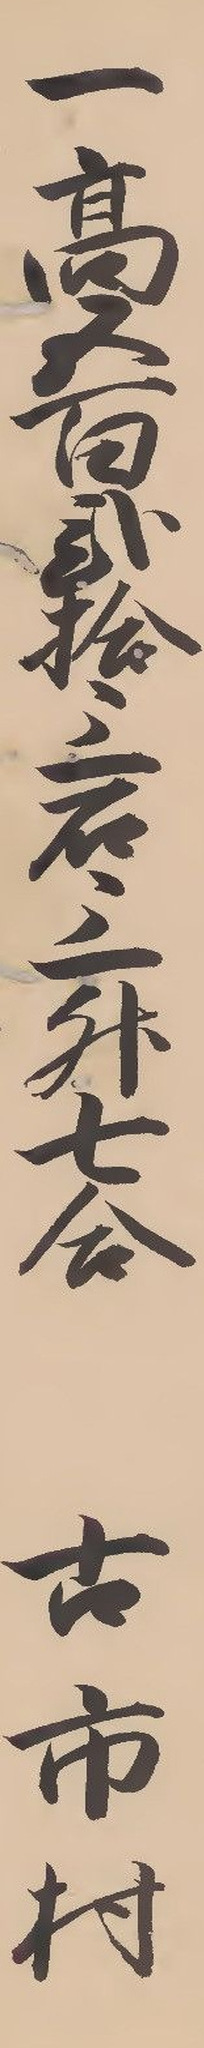一高五百弐拾三石三升七合古市村
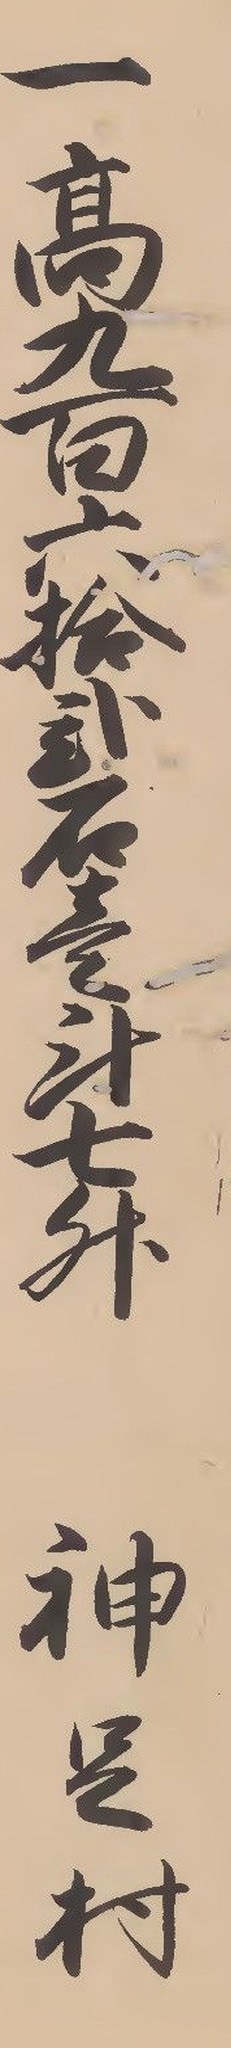一高九百六拾弐石壱斗七升神足村
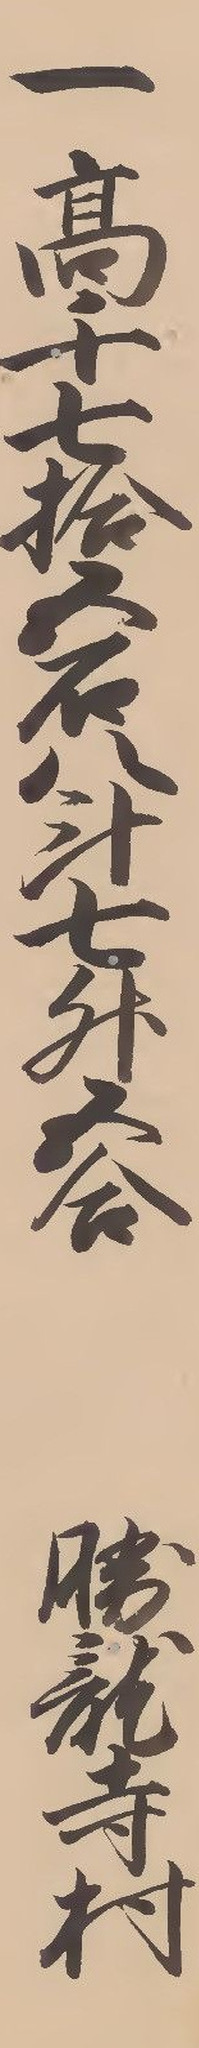一高千七拾五石八斗七升五合勝竜寺村
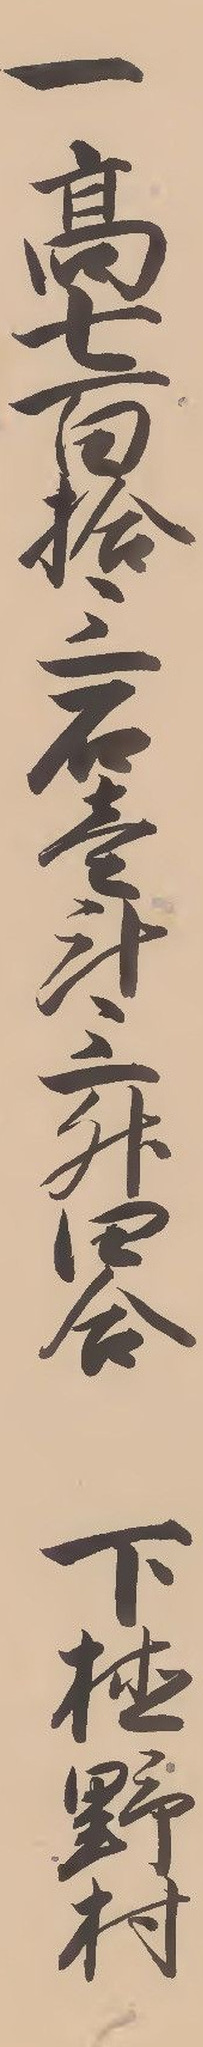一高七百拾三石壱斗三升四合下植野村
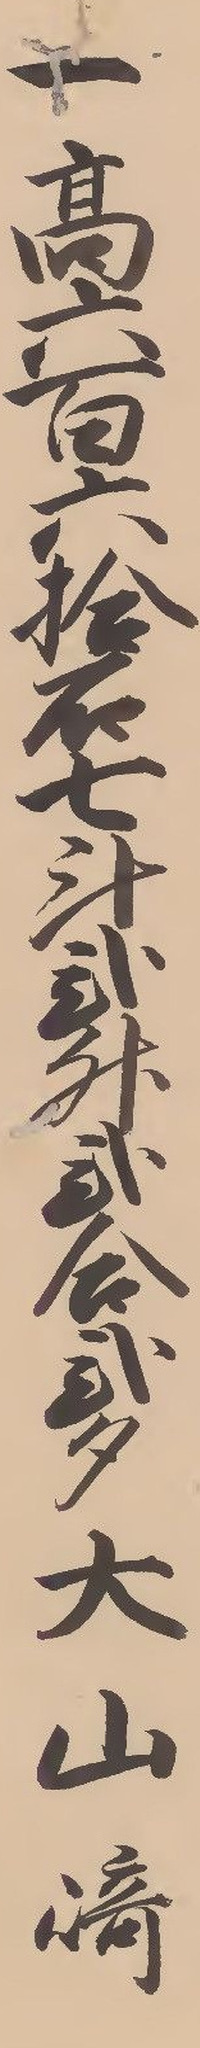一高六百六拾石七斗弐升弐合弐勺大山崎

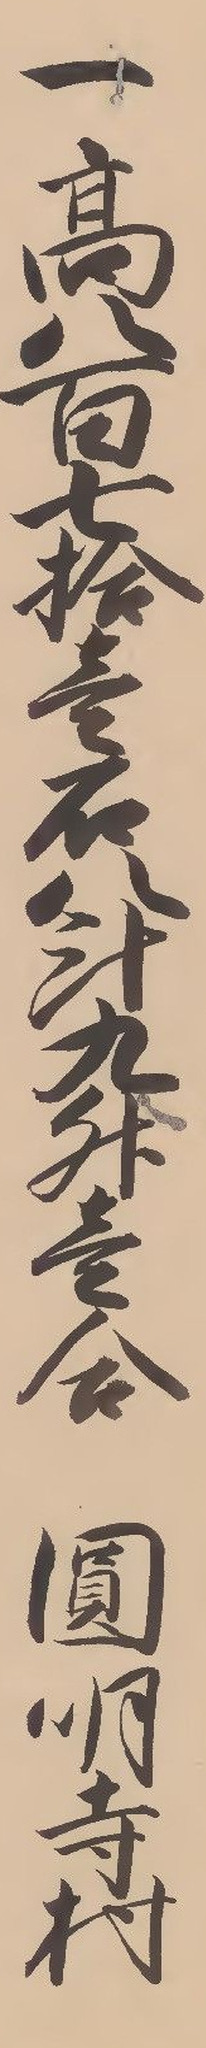一高八百七拾壱石八斗九升壱合円明寺村
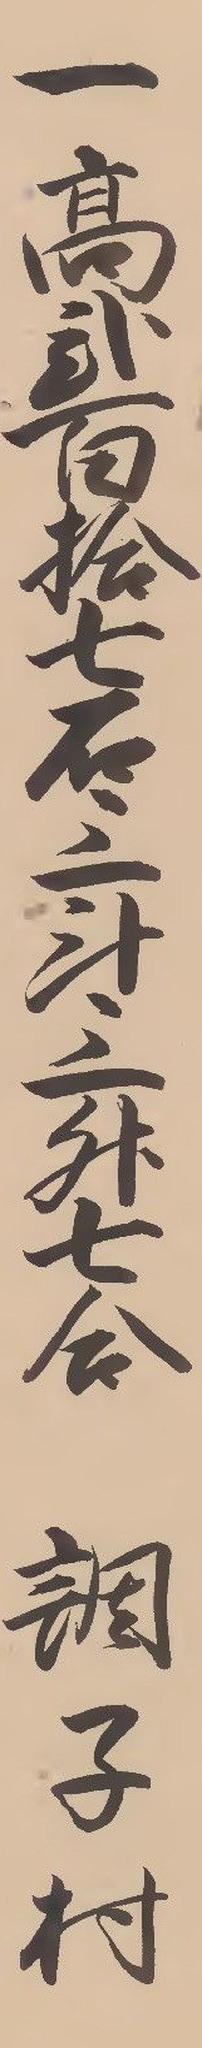一高弐百拾七石三斗三升七合調子村
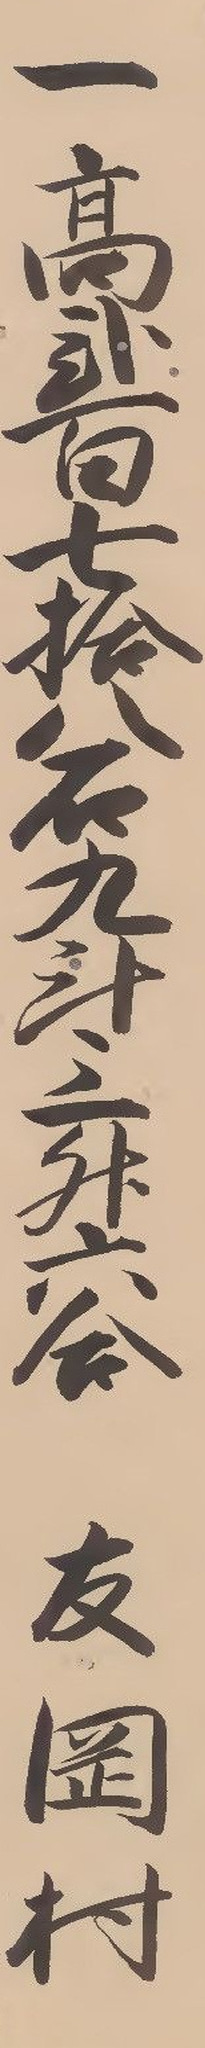一高弐百七拾八石九斗三升六合友岡村
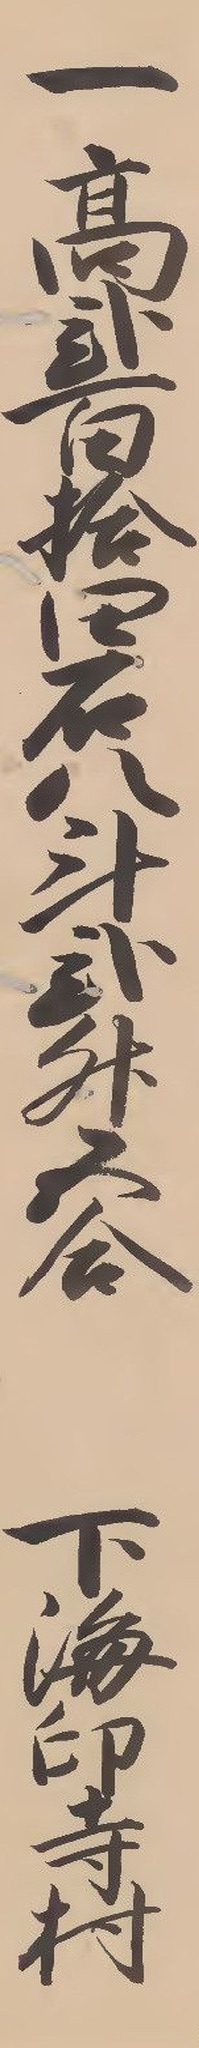一高弐百拾四石八斗弐升五合下海印寺村
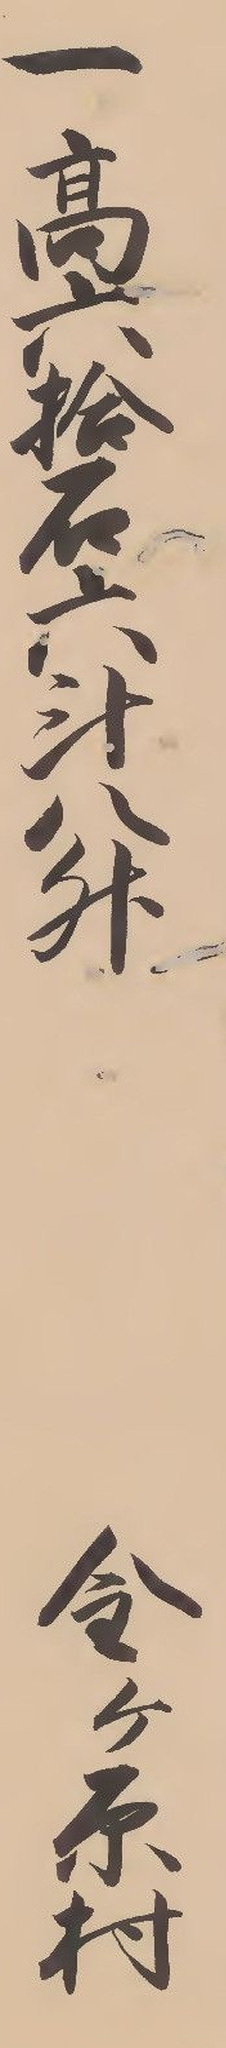一高六拾石六斗八升金ヶ原村
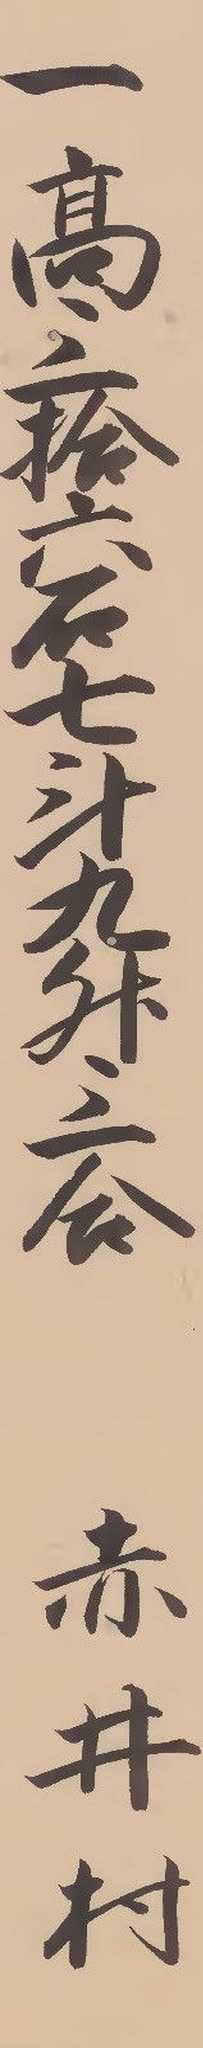一高三拾六石七斗九升三合赤井村
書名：山城国郷帳
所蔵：国立公文書館 National Archives of Japan
